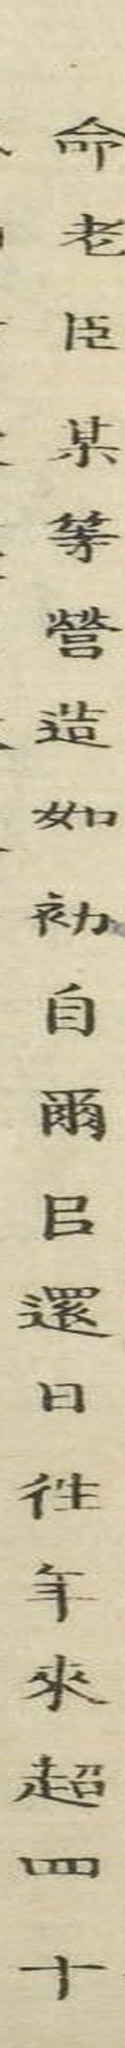命老臣某等営造如初自爾㠯還日往年来超四十
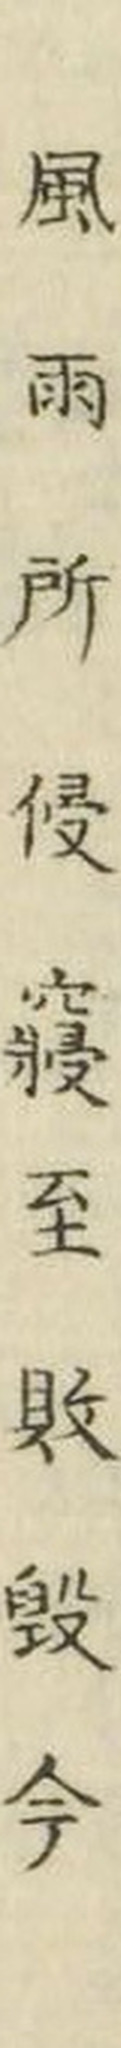風雨所侵寝至敗毀今
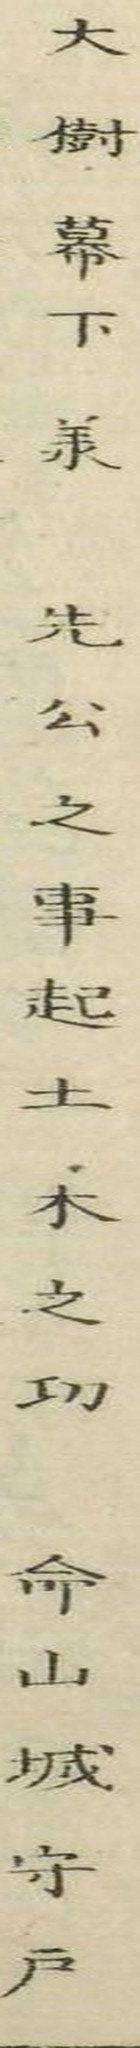大樹幕下承先公之事起土木之功命山城守戸
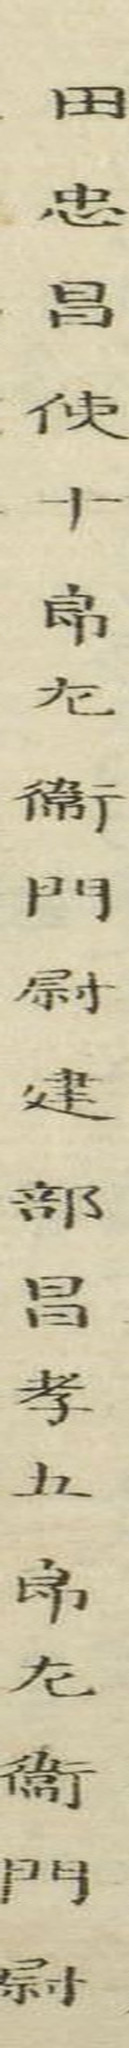田忠昌使十郎左衛門尉建部昌孝五郎左衛門尉
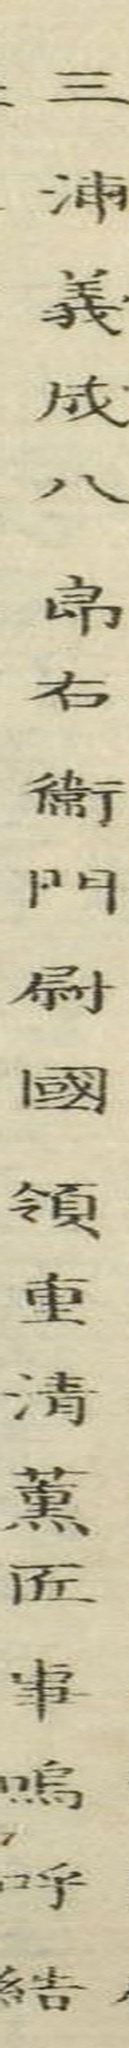三浦義成八郎右衛門尉国領重清薫匠事嗚呼結
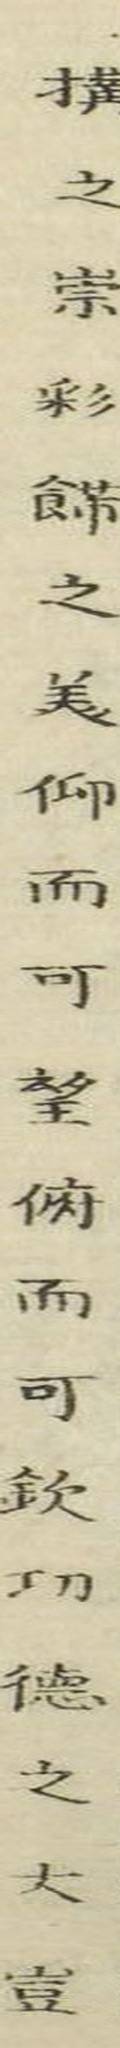搆之崇彩飾之美仰而可望俯而可欽功徳之大豈
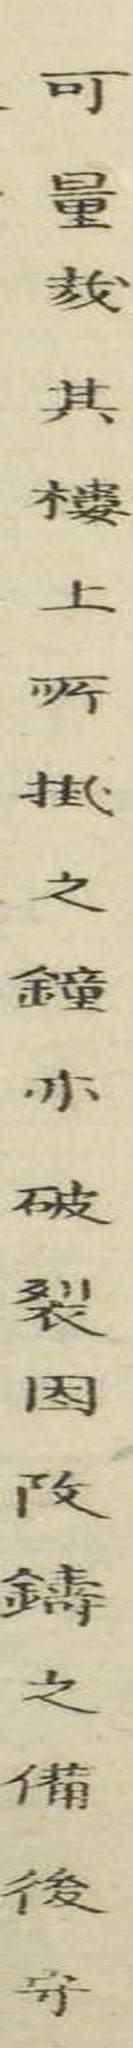可量哉其楼上所掛之鐘亦破裂因改鋳之備後守
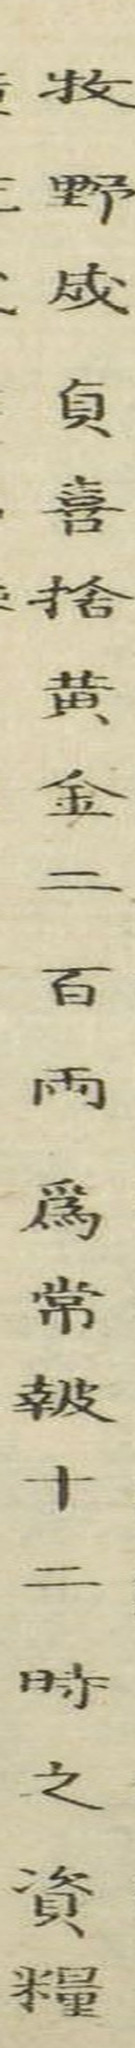牧野成貞喜捨黄金二百両為常報十二時之資糧
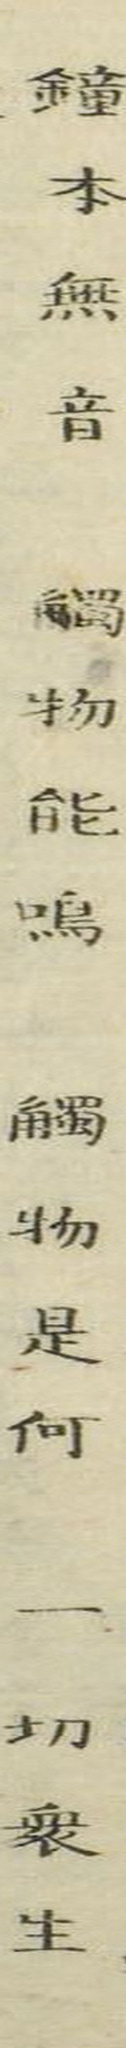鐘本無音触物能鳴触物是何一切衆生
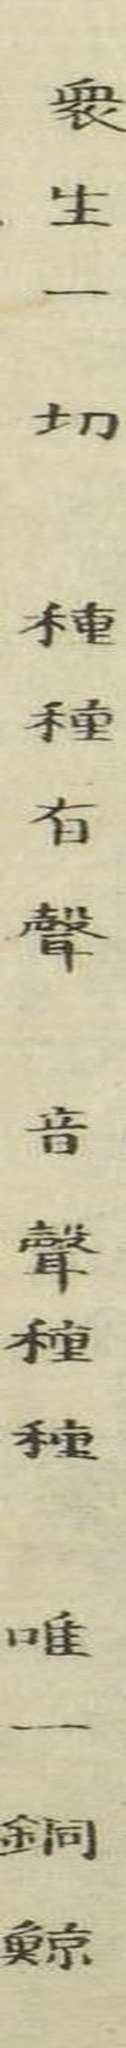衆生一切種種有声音声種種唯一銅鯨
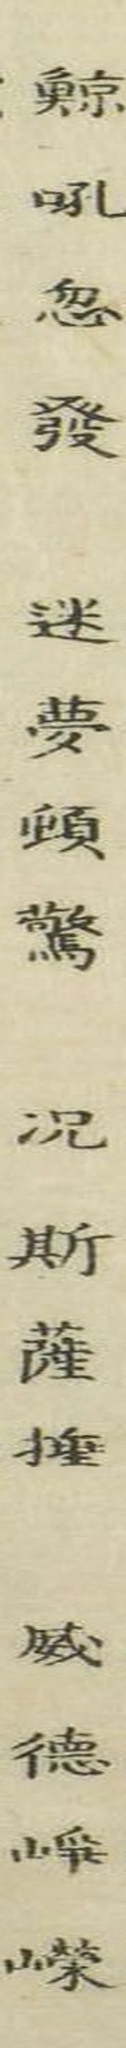鯨吼忽発迷夢頓驚况斯薩埵威徳崢嶸
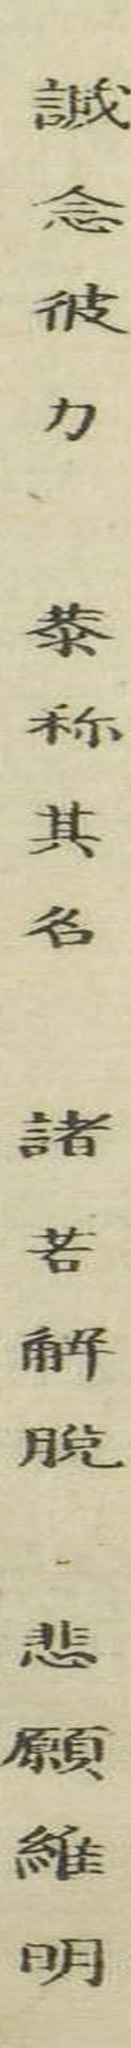誠念彼力恭称其名諸若解脱悲願維明
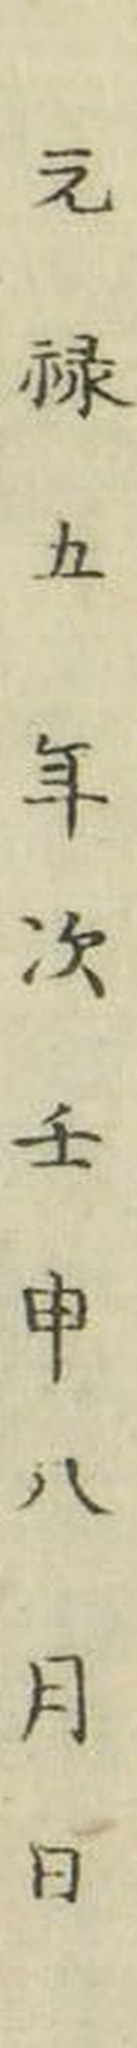元禄五年次壬申八月日
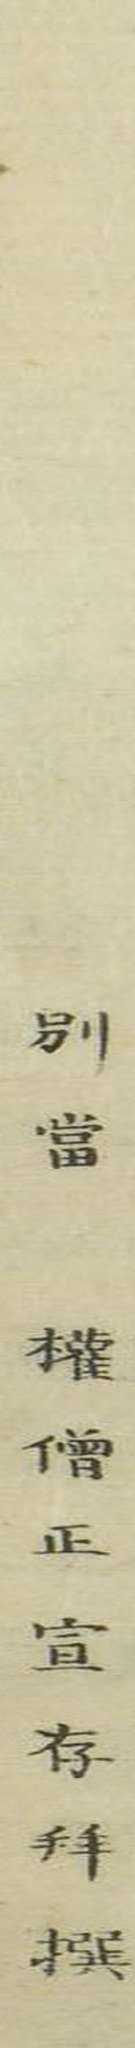別当権僧正宣存拝撰
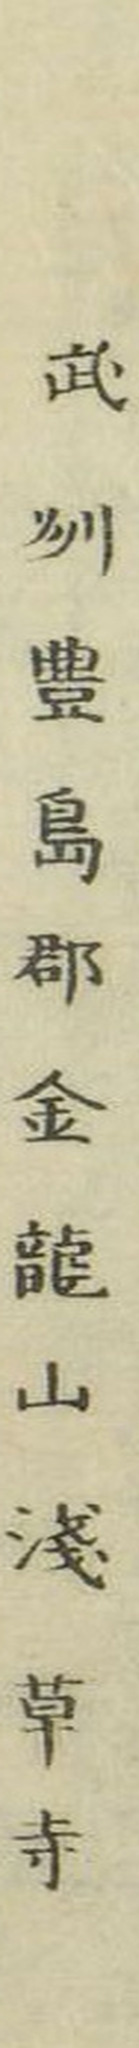武州豊島郡金龍山浅草寺

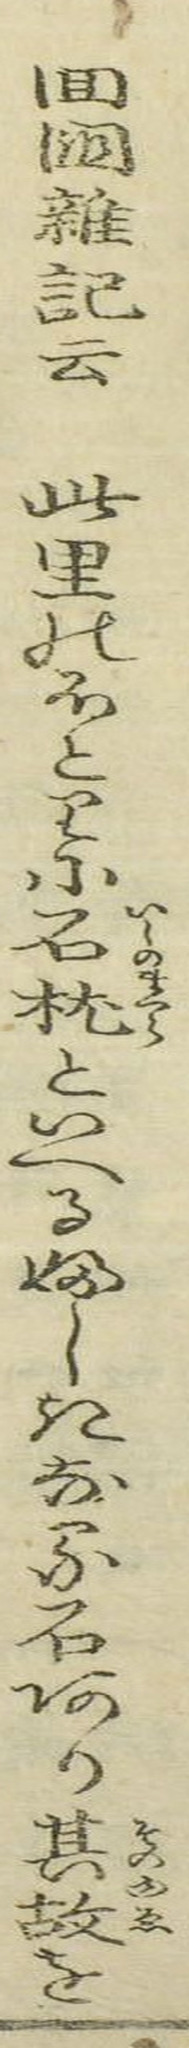回国雑記云此里のほとりに石枕といへるふしきなる石あり其故を
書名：江戸名所図会 20巻 巻之16
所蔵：東京学芸大学教育コンテンツアーカイブ
